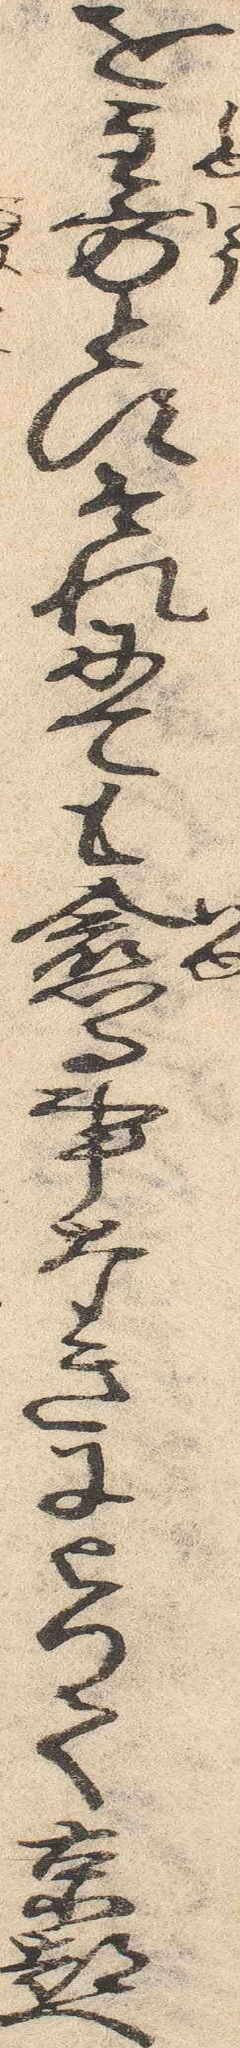を主方とすそれにても愈る事なきによりて京都へ
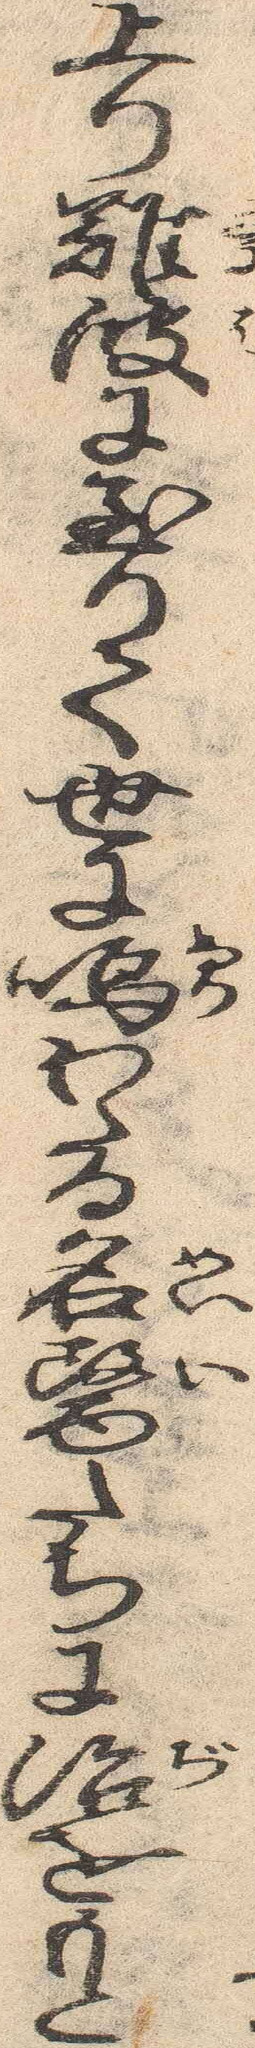上り難波に至りて世に鳴わたる名医たちに治をもと
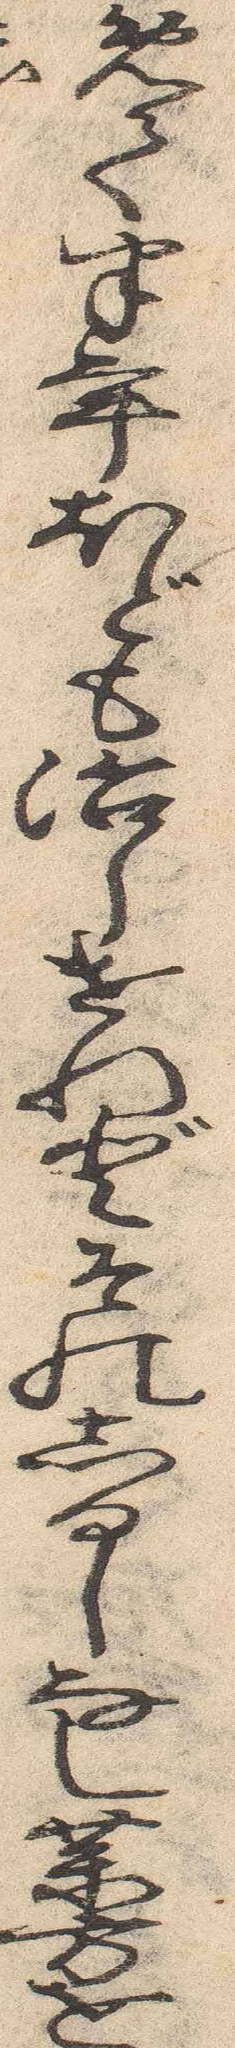めて半年ほども治しけれどそのしるしなし薬方を
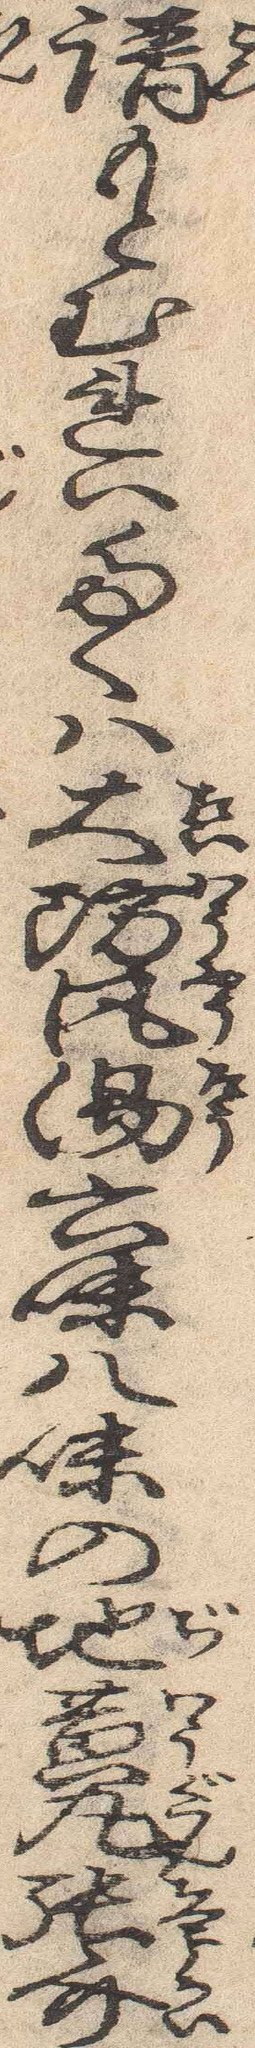請もとむれは多くは大防風湯六味八味の地黄丸脹介
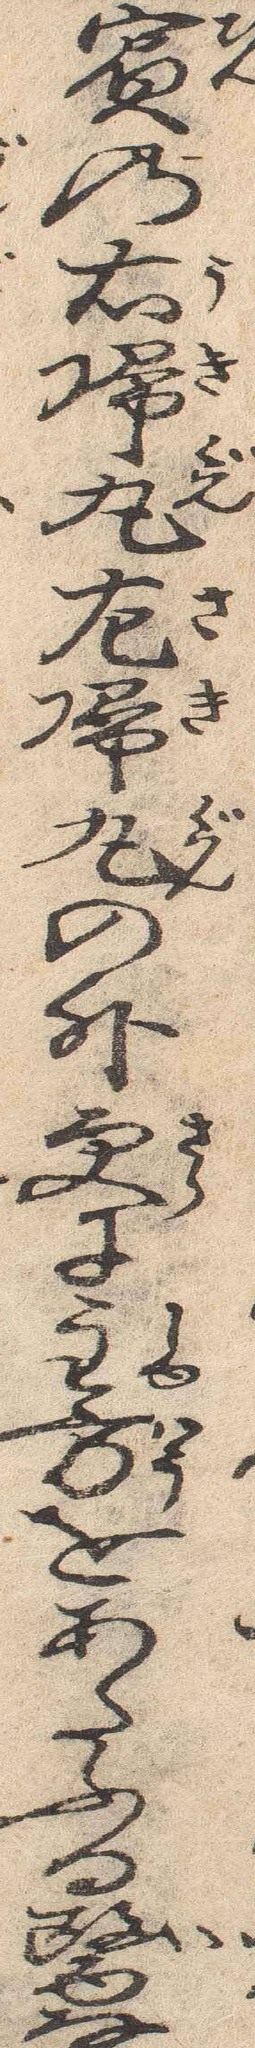賓の右帰丸左帰丸の外更に主方をあたふる医な
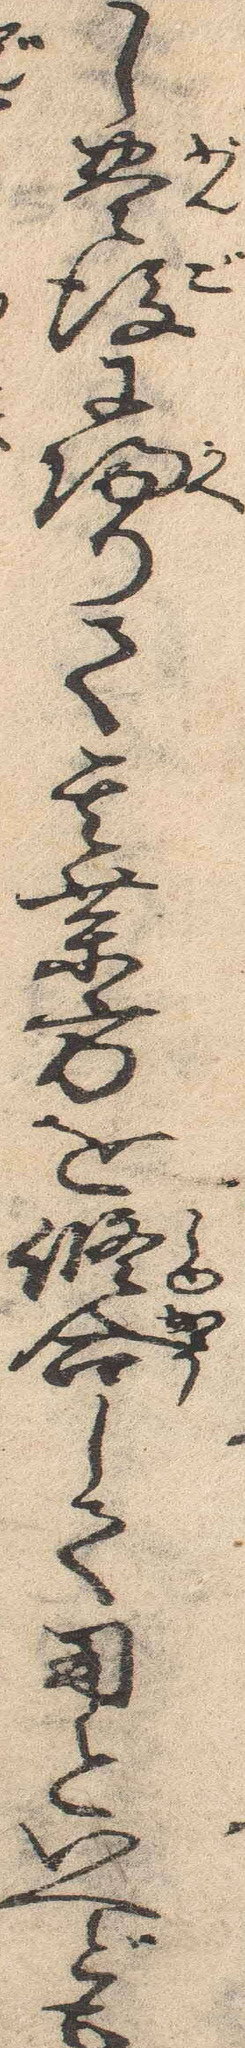し豊後に帰りて其薬方を修合して用といへども
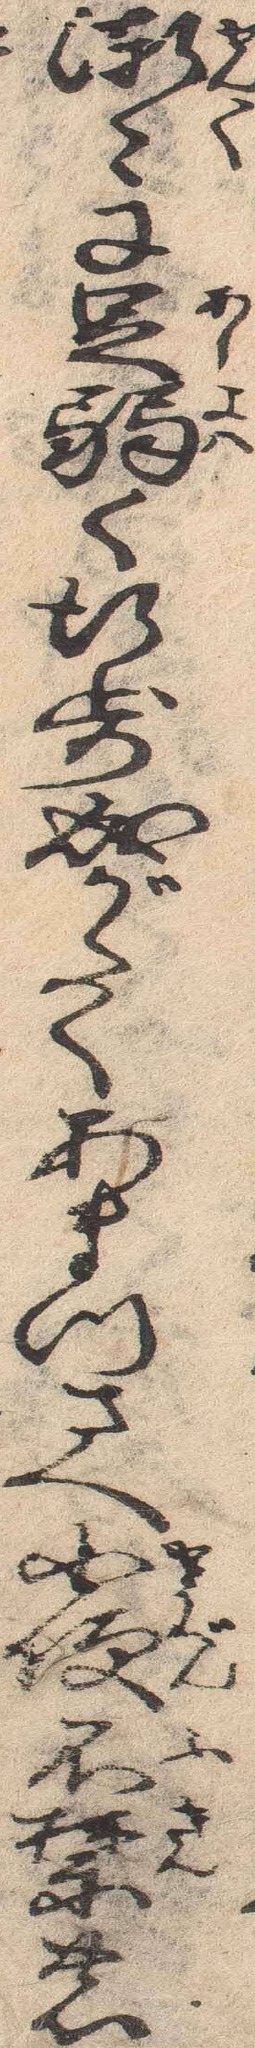漸々に足弱く行歩成がたくあまつさへ小便不禁の
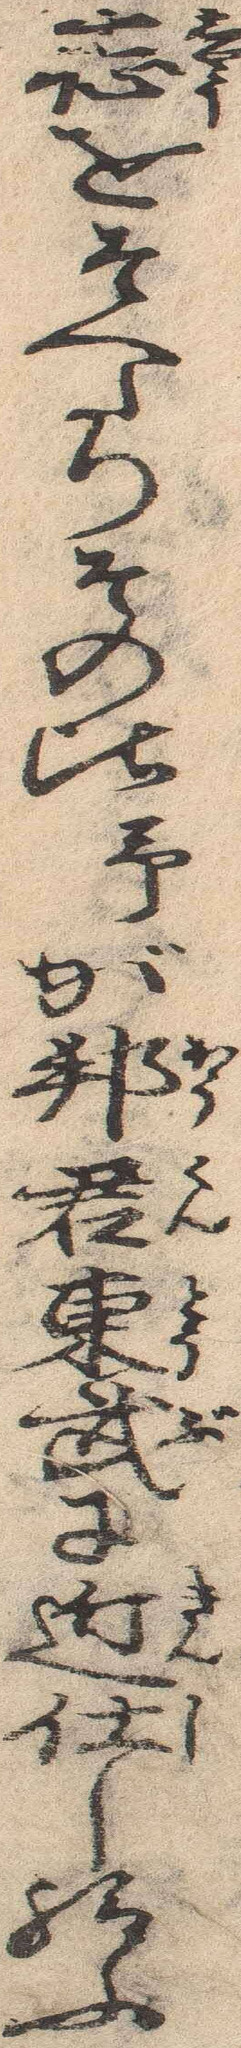症をそへたりその比予が邦君東武に近仕し給ふ
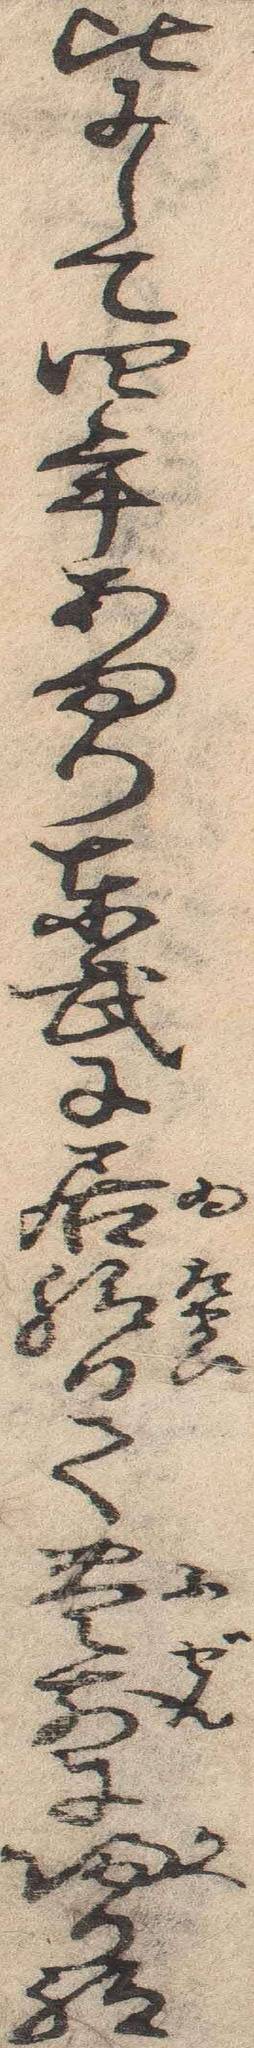比にして四年あまり東武に居給日て豊前に帰り給
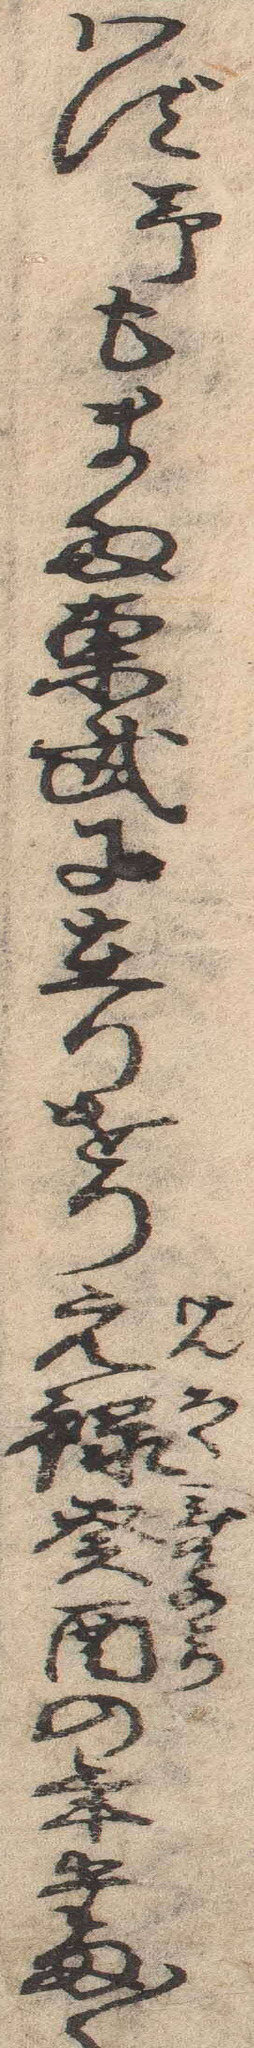わず予もまた東武に在りけり元禄癸酉の年たま〳〵

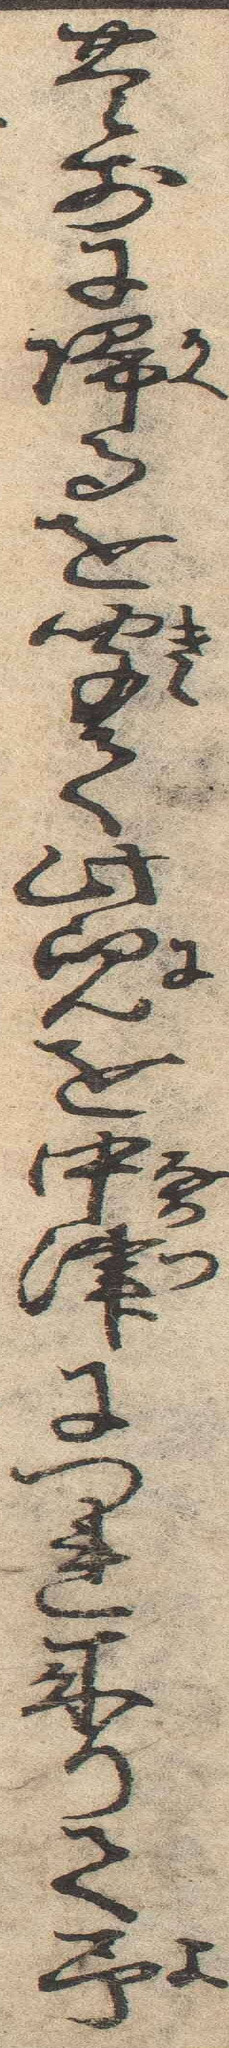豊前に帰るを聞て此児を中津につれ来りて予
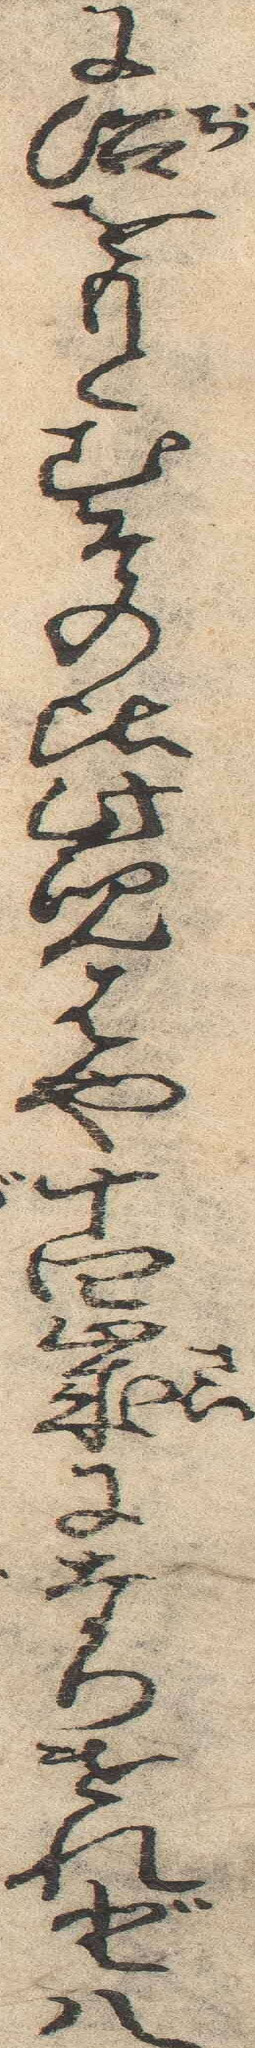に治をもとむその比此児はや十四歳になりけれど八
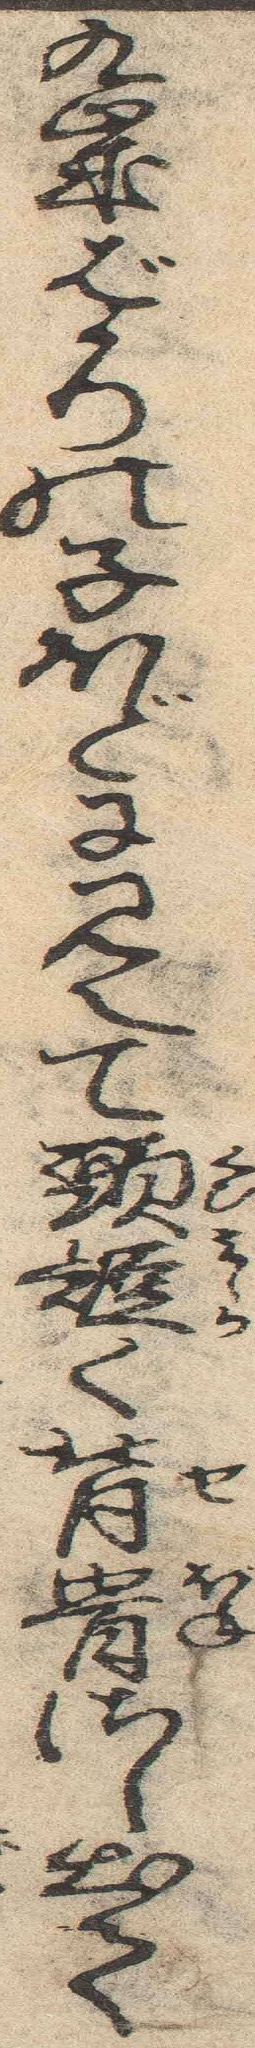九歳ばかりの子ほどに見えて頸短く背骨さし出て
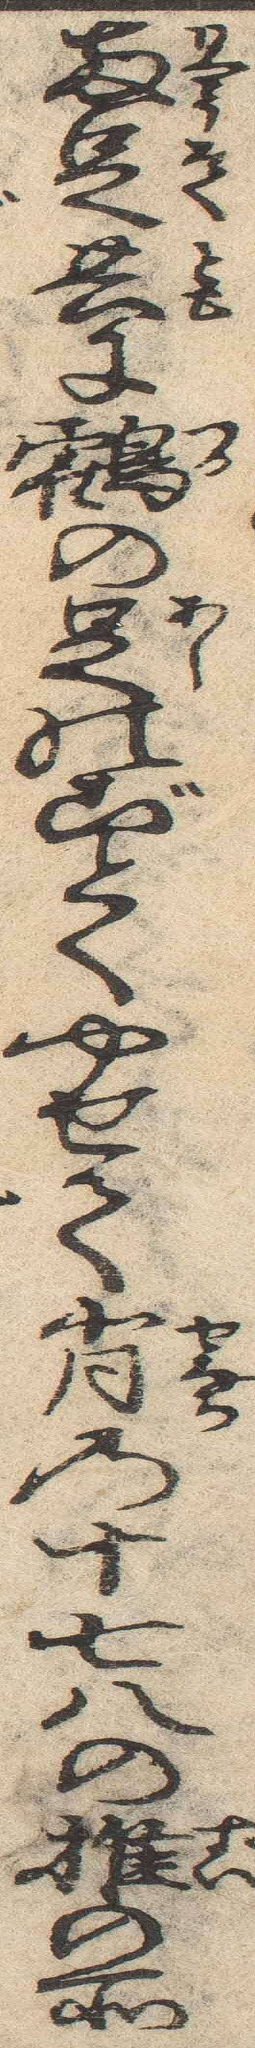両足と共に鶴の足のごとくやせて背の十七八の椎の所
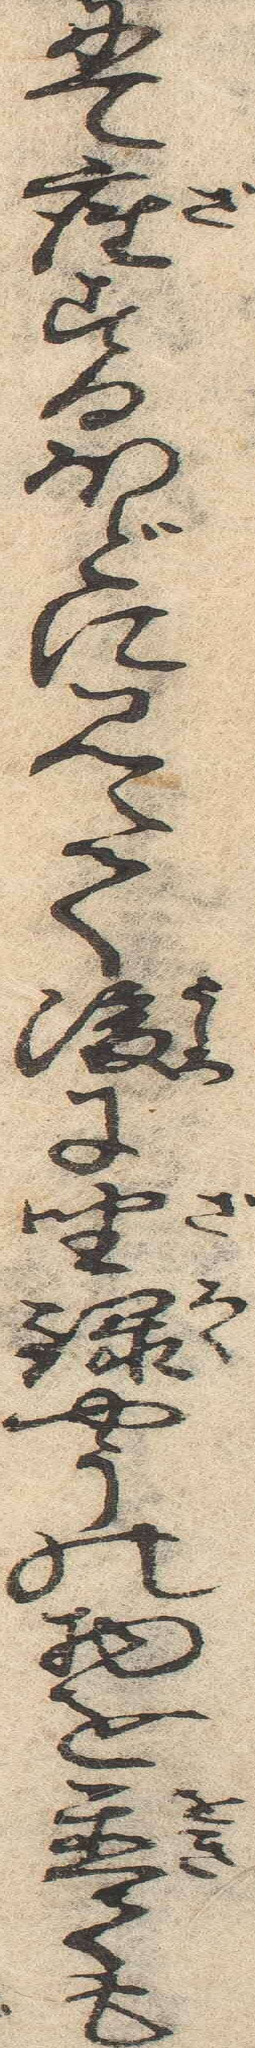にて座するほどに見えて後に坐録やうの物を置ても
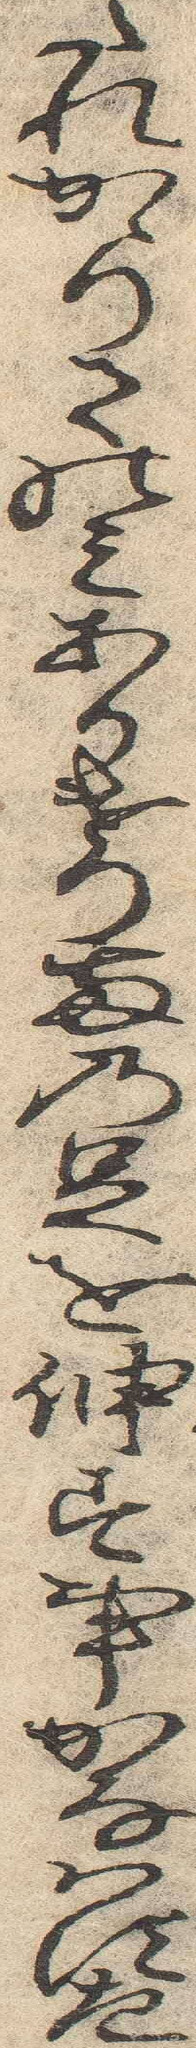たれかゝりてのみありけり両の足を伸す事かなはず左
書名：小児必用養育草
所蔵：東京学芸大学附属図書館 国文学研究資料館
